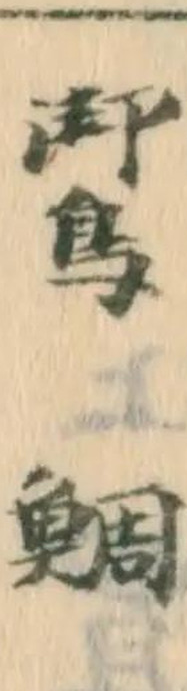御鳥鯛
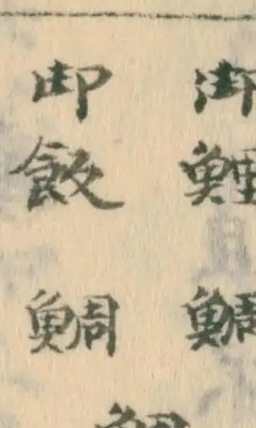御鳥鯛
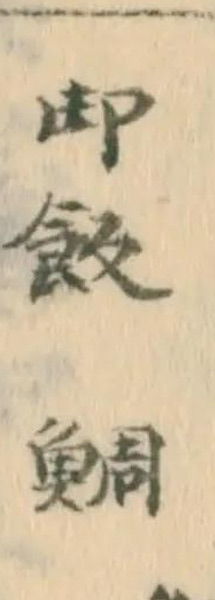御鳥鯛
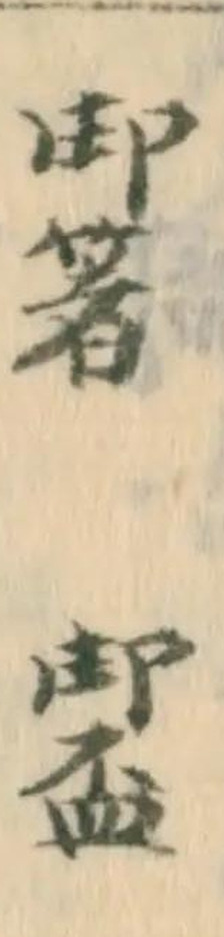御箸御盃

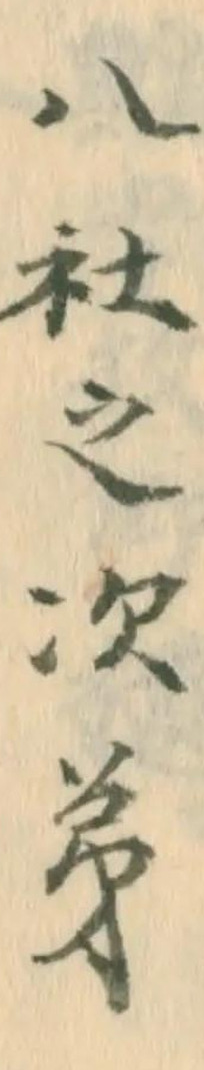八社之次第
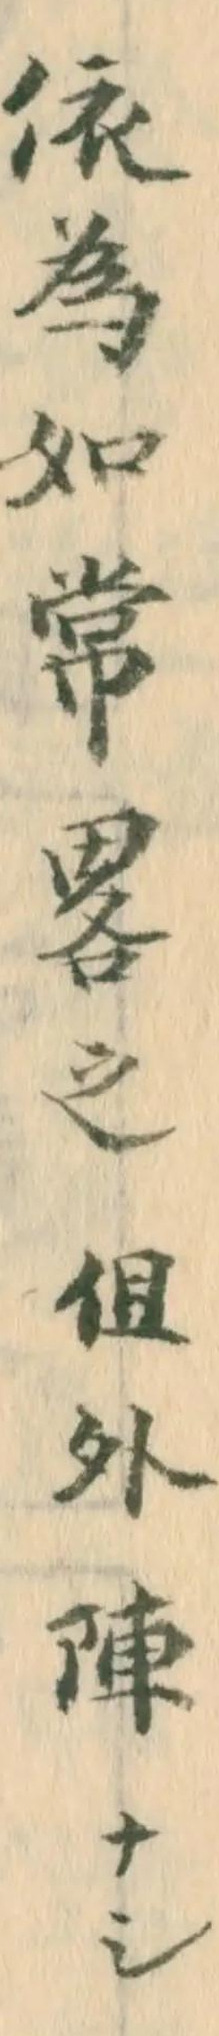依為如常略之但外陣ナシ
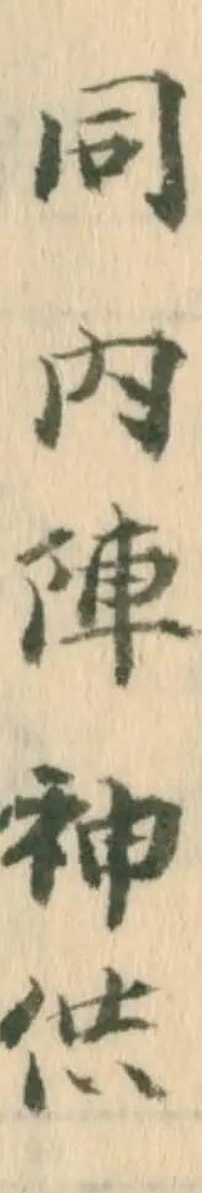同内陣神供
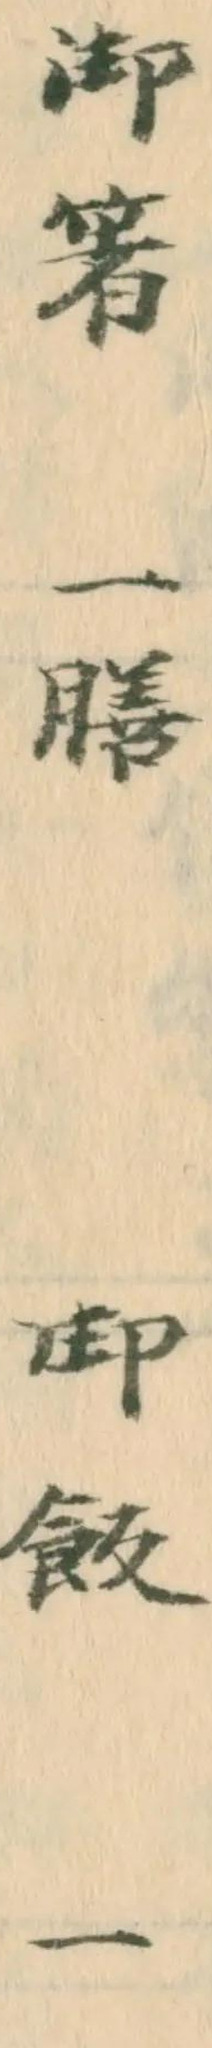御箸一膳御飯一
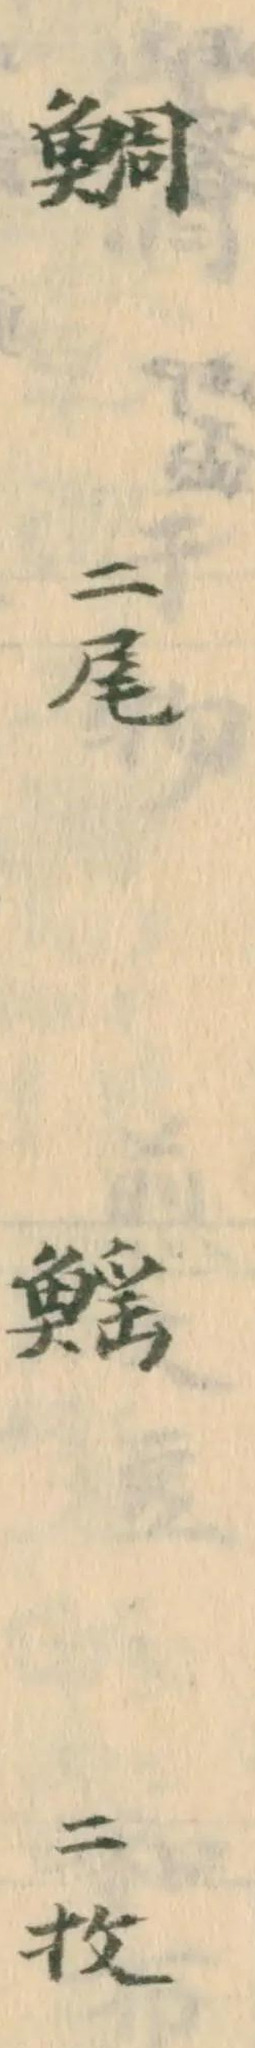鯛二尾鰩二枚
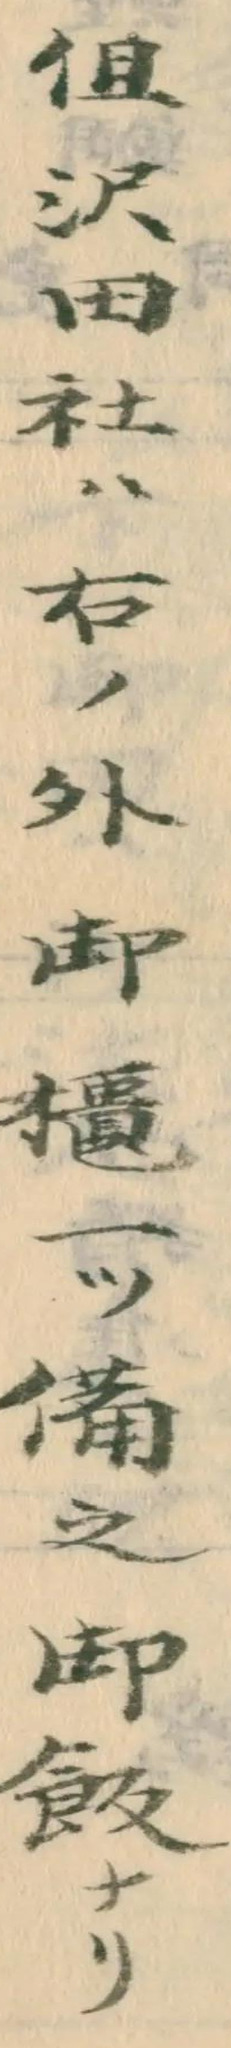但沢田社ハ右ノ外御櫃一ツ備之御飯ナリ
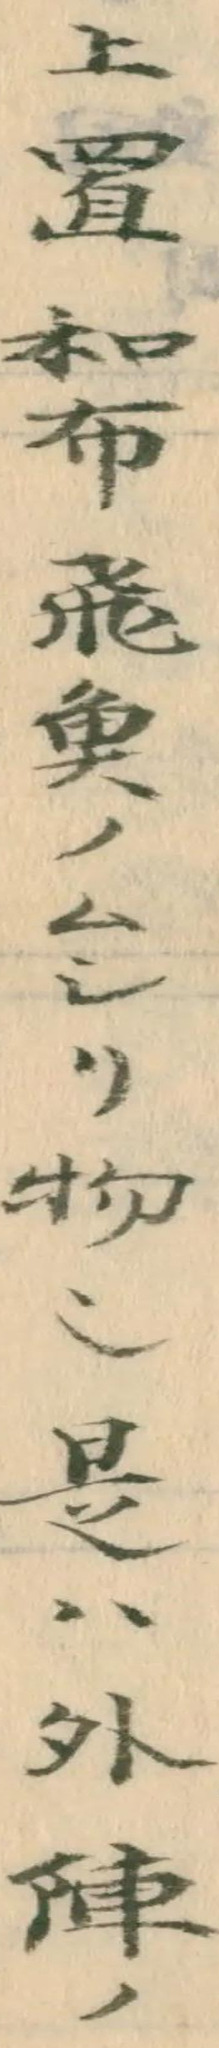上置和布飛魚ノムシリ物也是ハ外陣ノ
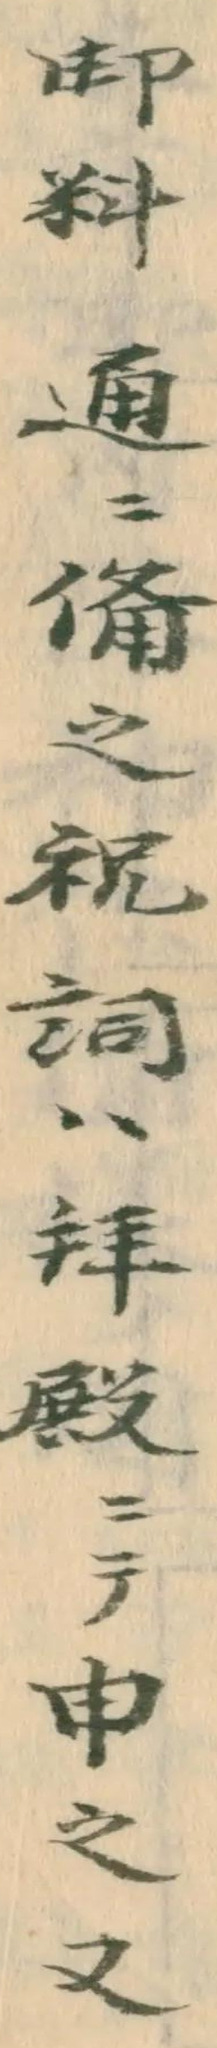御料通ニ備之祝詞ハ拝殿ニテ申之又
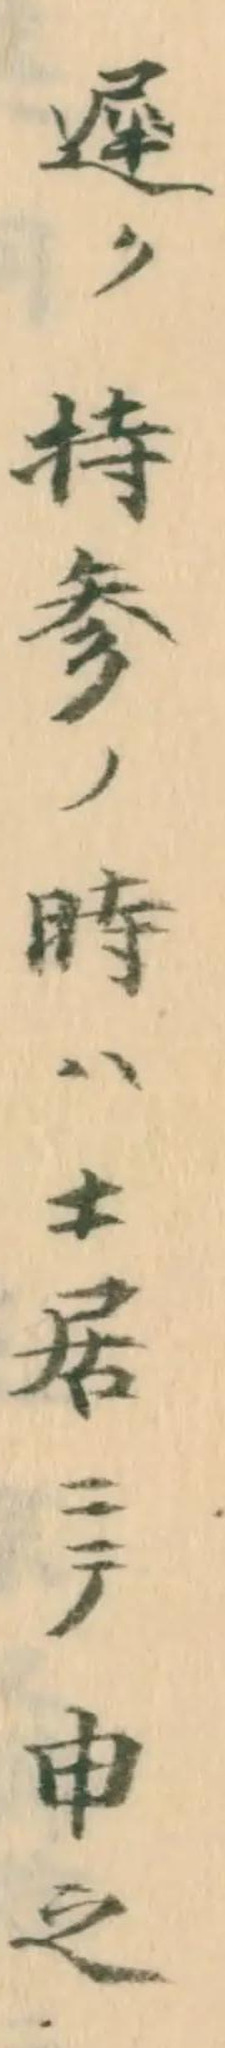遅ク持参ノ時ハ土居ニテ申之
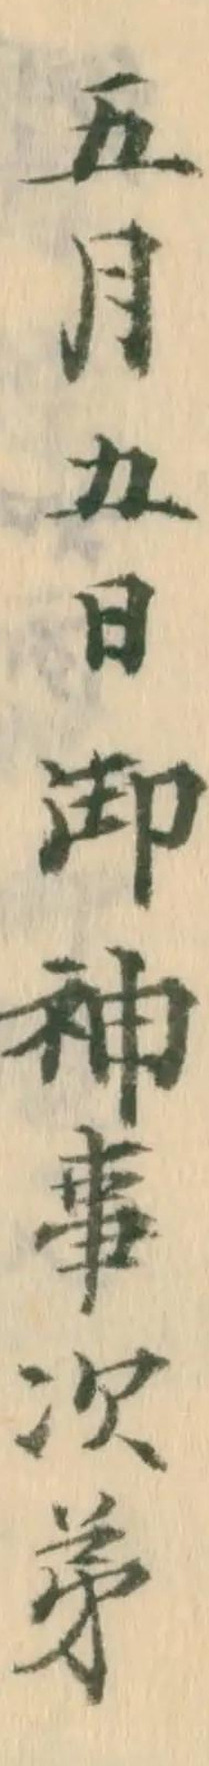五月五日御神事次第
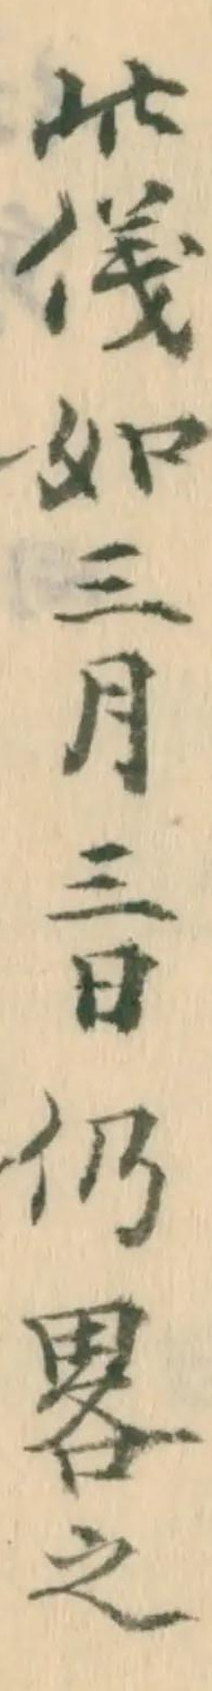此儀如三月三日仍略之
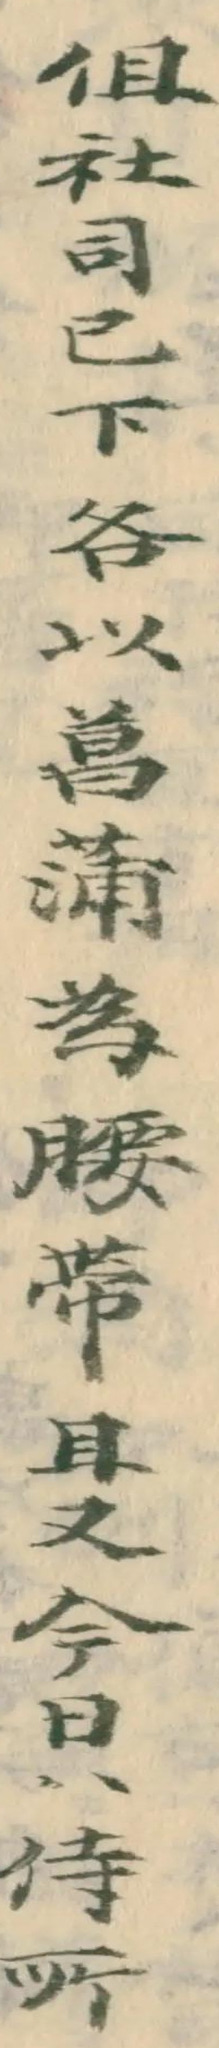但社司已下各以菖蒲為腰帯且又今日ハ侍所
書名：賀茂社記録. 第5冊
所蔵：国立国会図書館 National Diet Library, JAPAN
